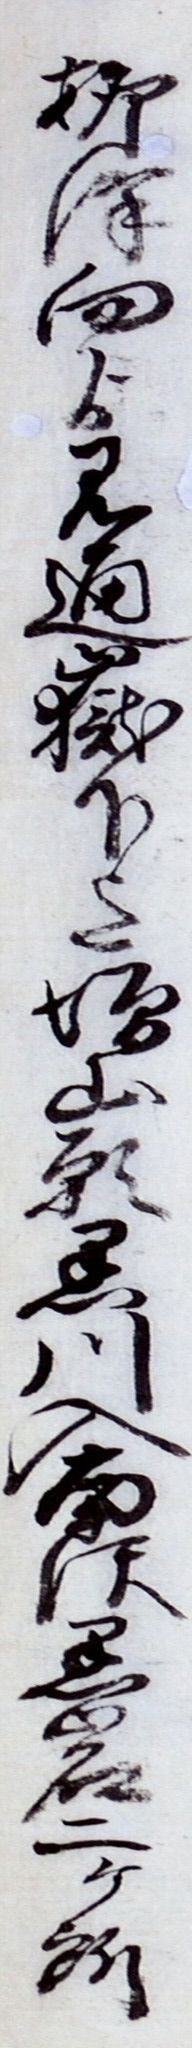柳津向より見通嶽下迄増山願黒川入南沢黒田石二ヶ所
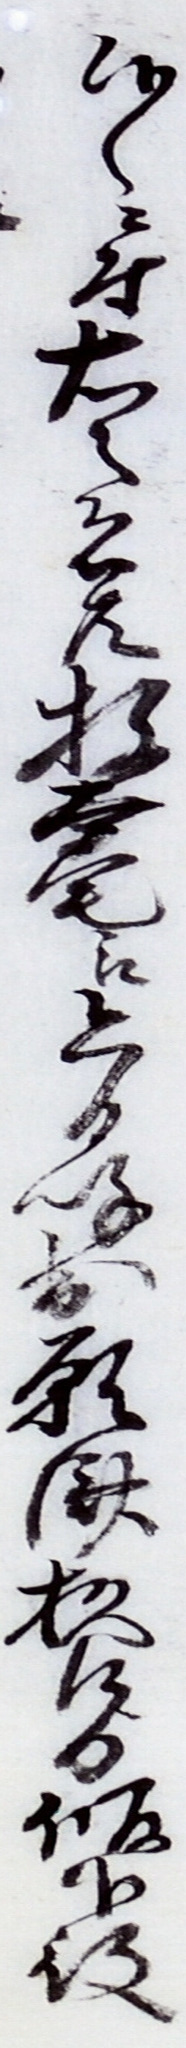候ニ付右之者共牧太宅江上より呼出願済杉左衛門仮下役
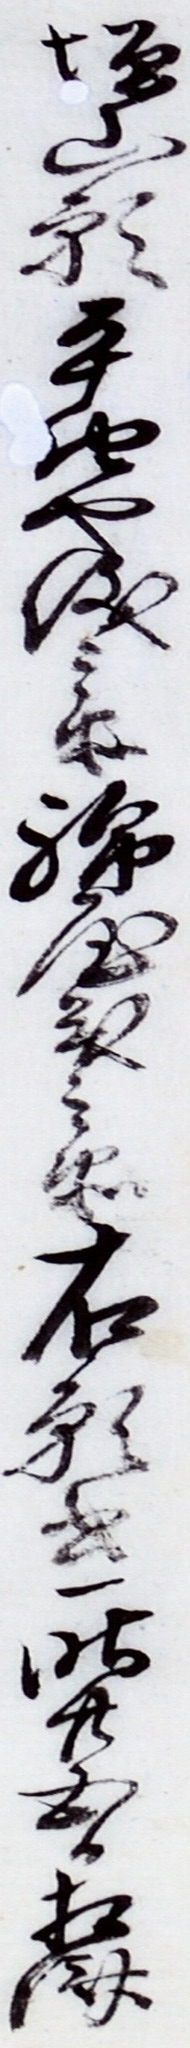一増山願平野や儀兵衛綿屋義兵衛右願書一昨廿五日相済
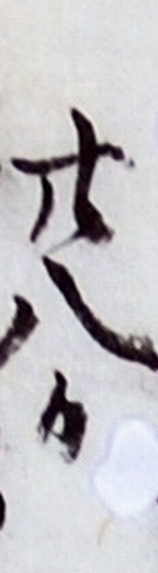廿八日
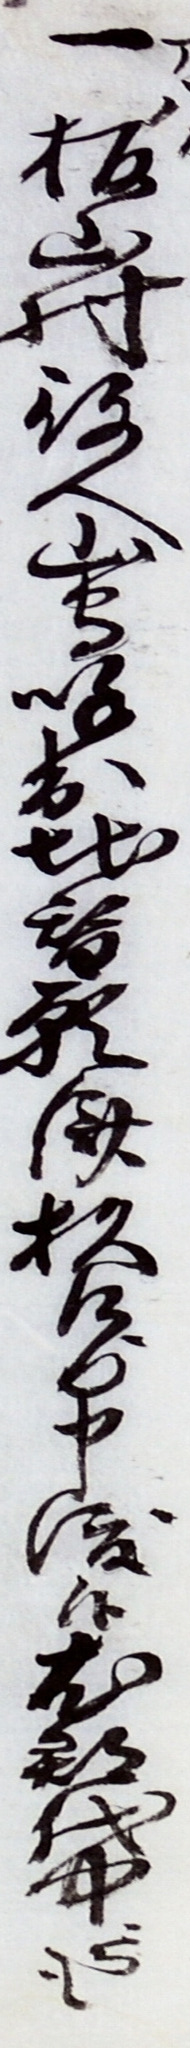一板山村役人山守呼出地替願済杉左衛門申渡候尤郡代中ニ而も
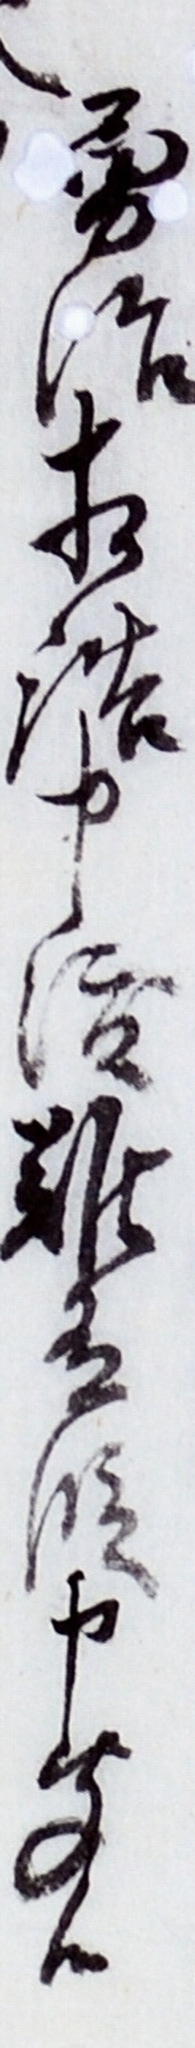勇治相詰申渡難有段申聞候
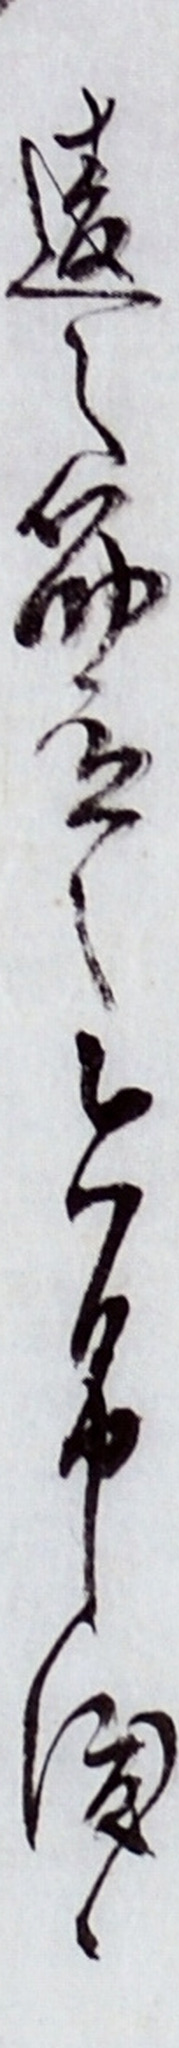違之筋立之候以上申渡候
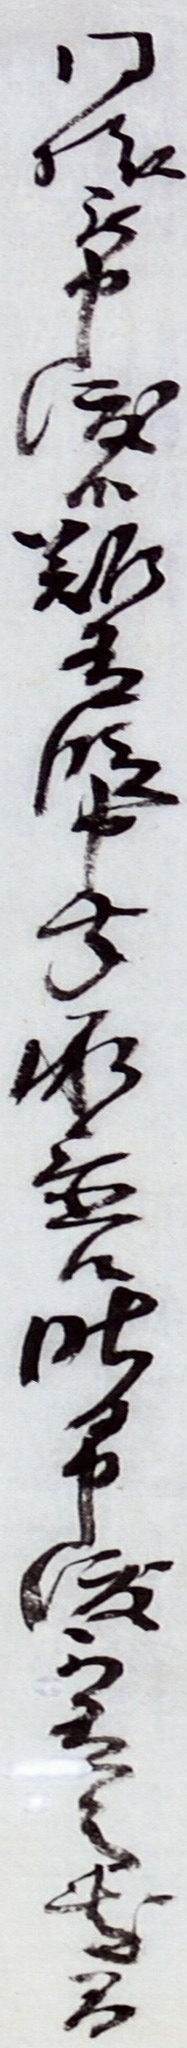同様被申渡候難有段申聞承置候昨日申渡可有之間
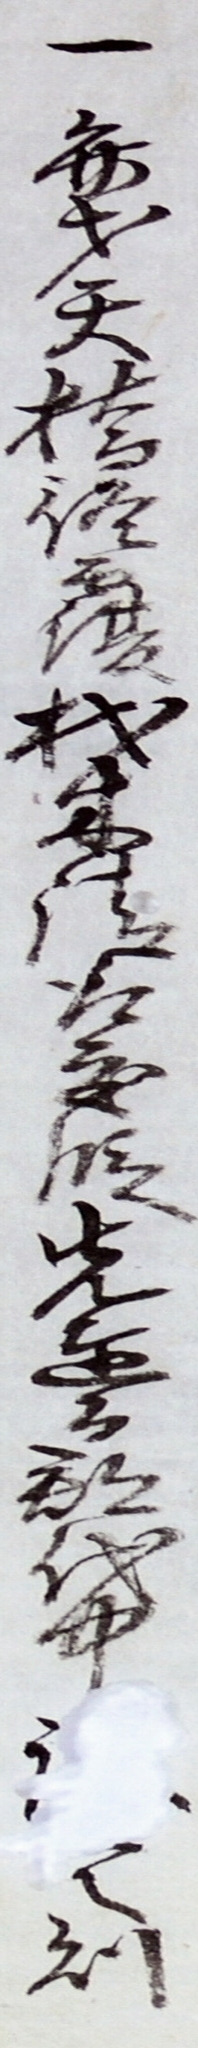一弁才天橋修覆材木請取置段先達而郡代中之別
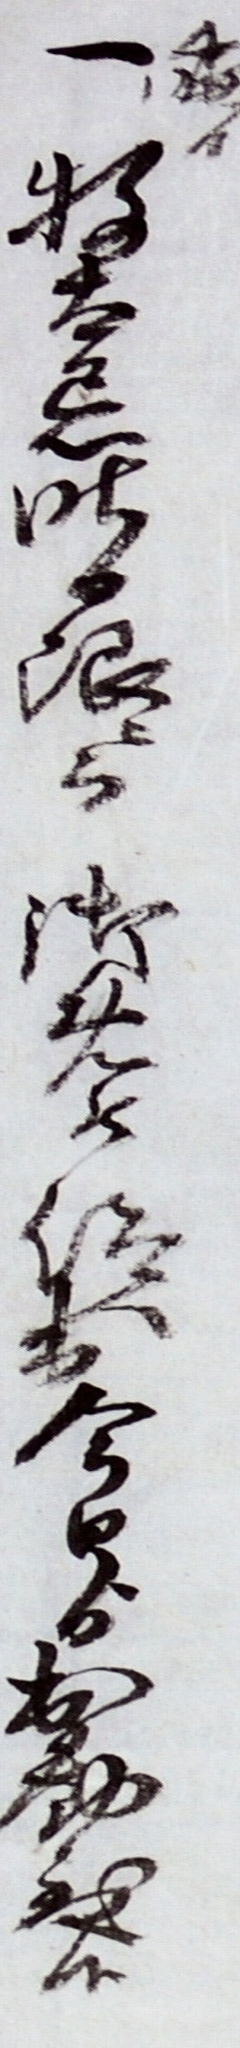一牧太忌昨日限ニ而御免被仰出今日より出勤致候
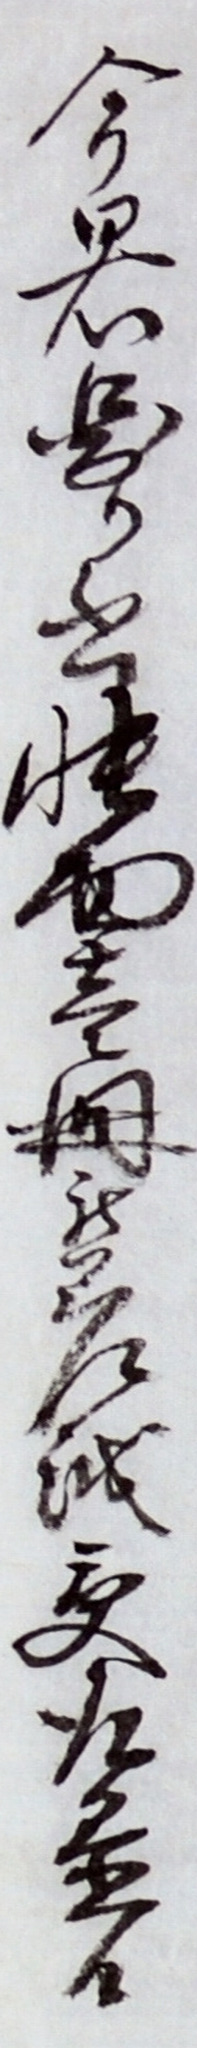今日右図り出帳面壱冊被差越受取置候

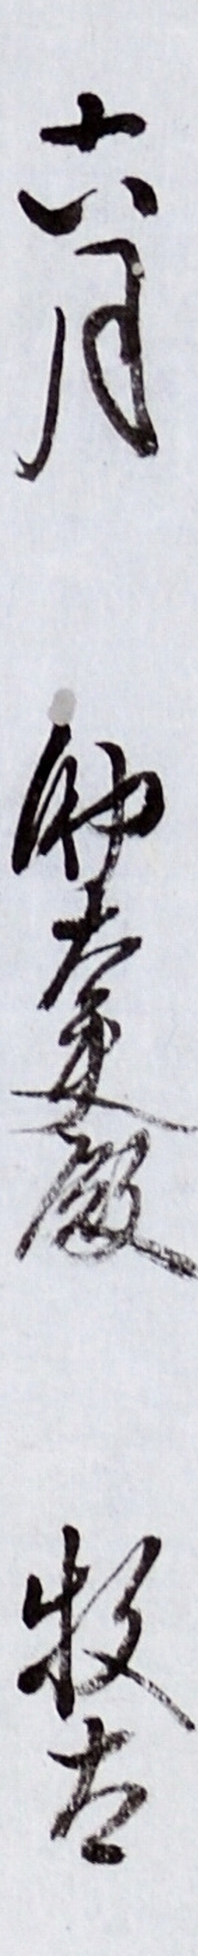六月助太夫殿牧太
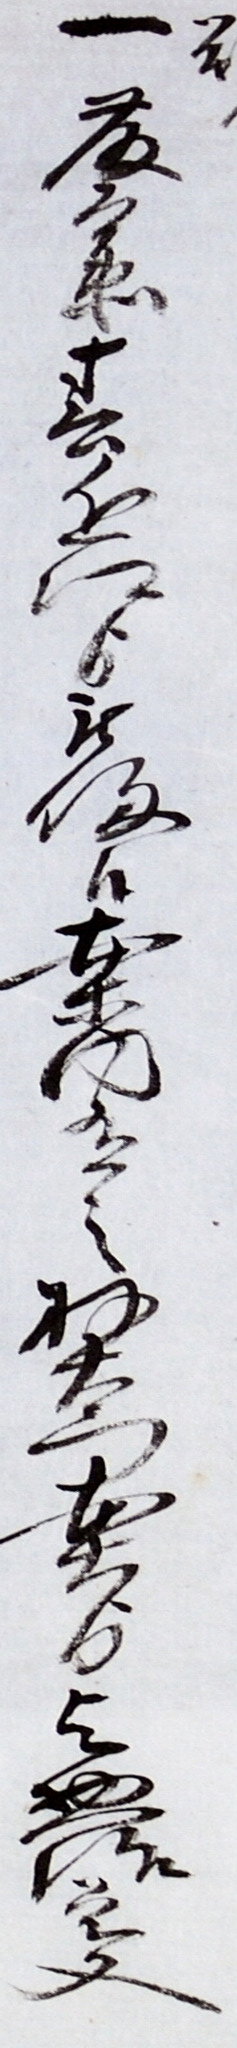一藤兵衛春近郷ゟ被帰候案内有之羽右衛門安右衛門与惣治尚又
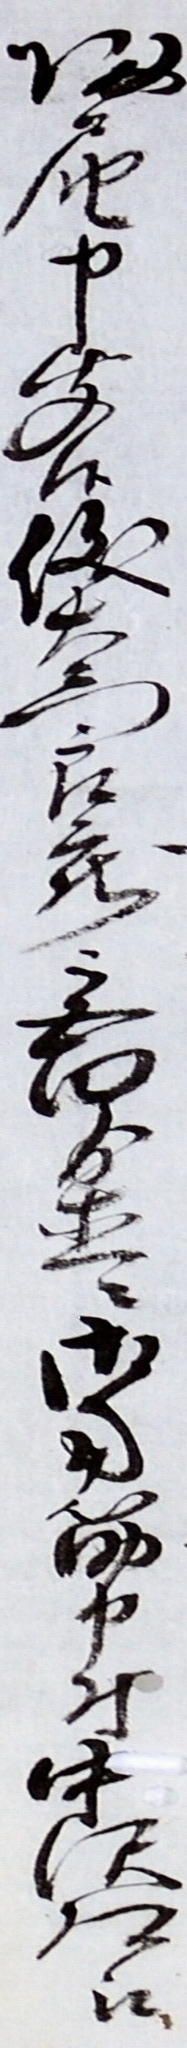帰届申聞候儀右衛門良蔵宮田ゟ直ニ御用筋申付中沢郷江
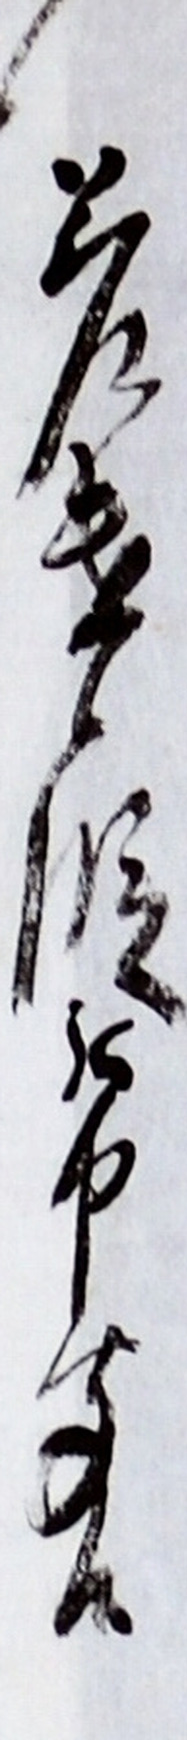差遣候段被申聞候
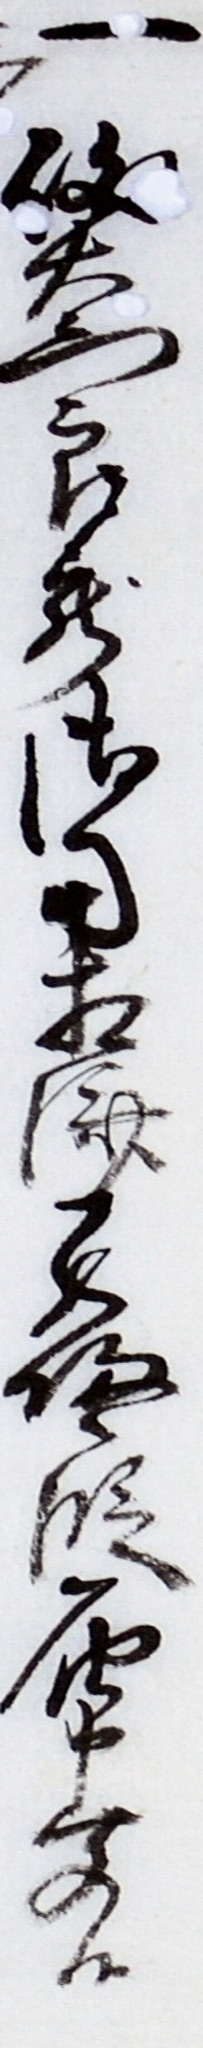一儀右衛門良蔵御用相済罷帰候段届申聞候
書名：御山奉行御用控
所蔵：伊那市立高遠町図書館・合同会社AMANE
